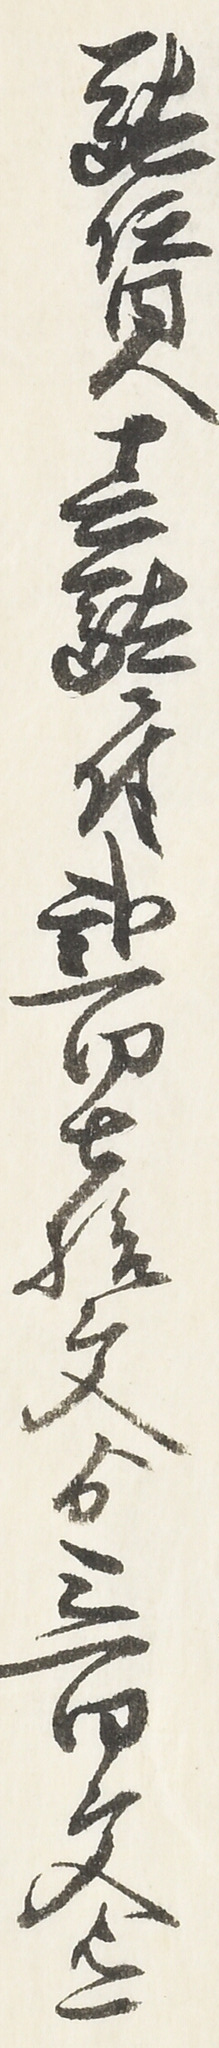駄賃壱駄ニ付弐百七拾文ゟ三百文迄
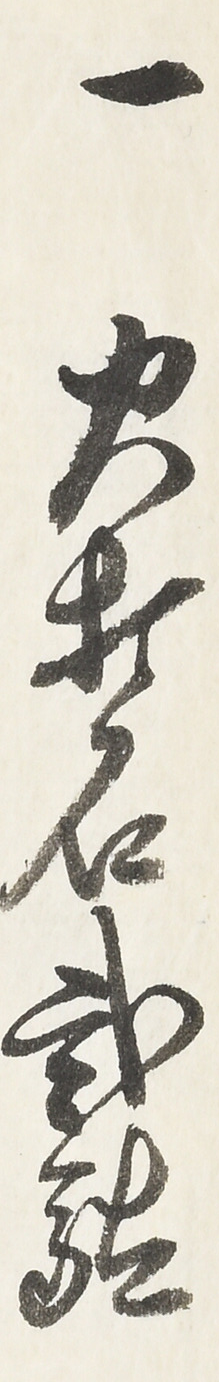一火打石弐駄但
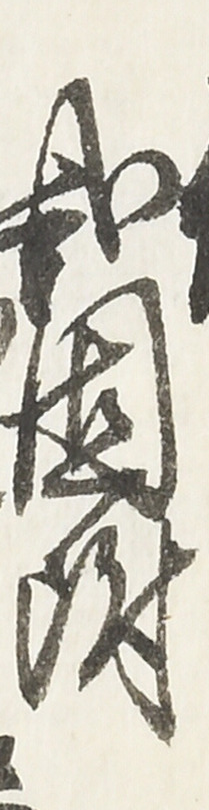弐固附
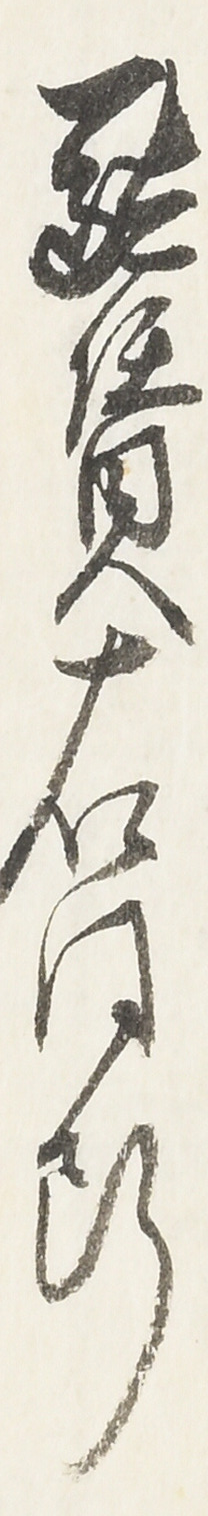駄賃右同断
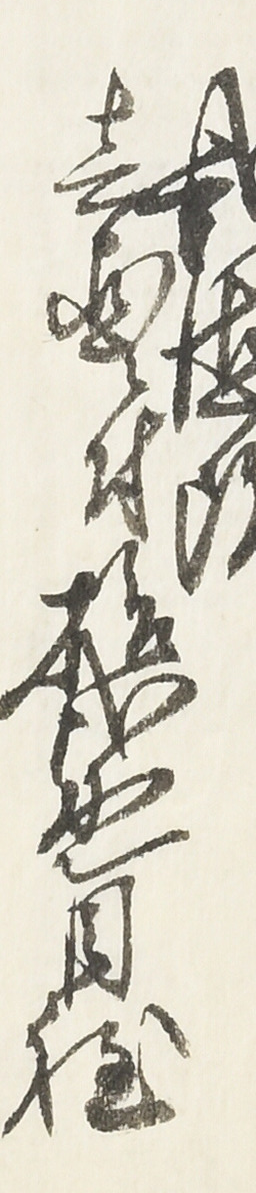壱固ニ付拾弐貫目程
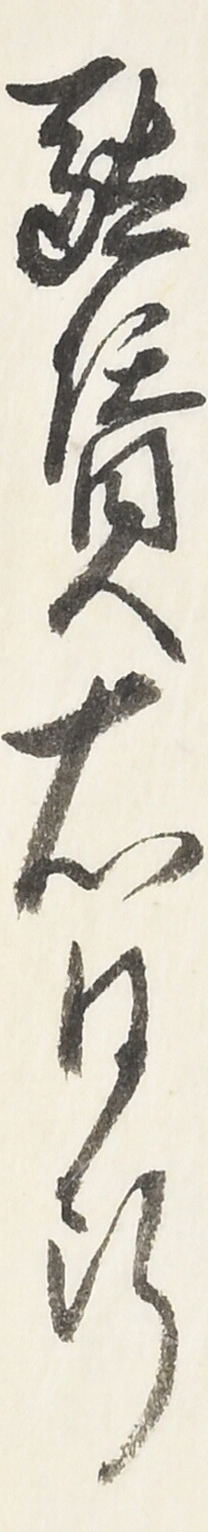駄賃右同断
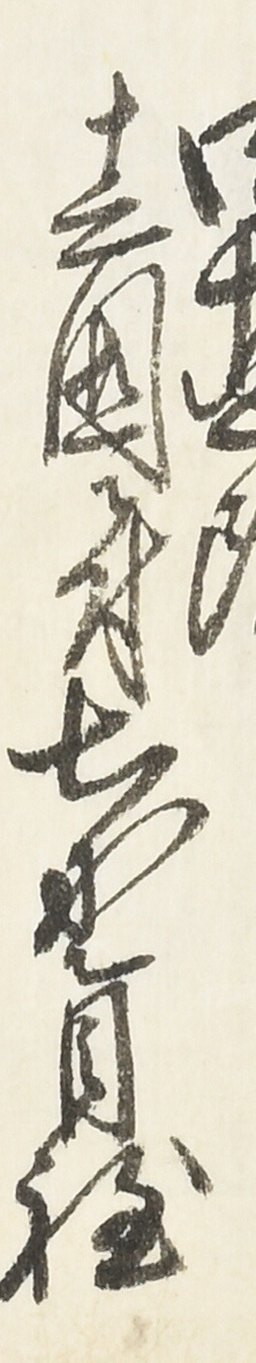壱固ニ付七貫目程

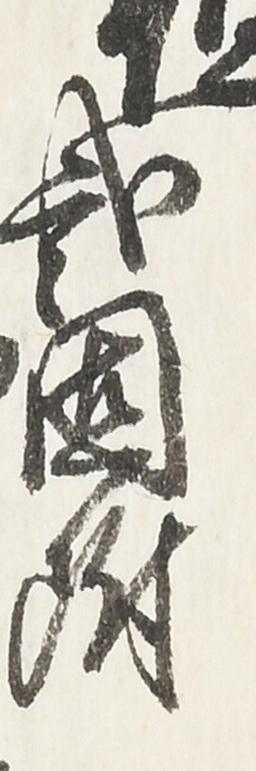弐固附
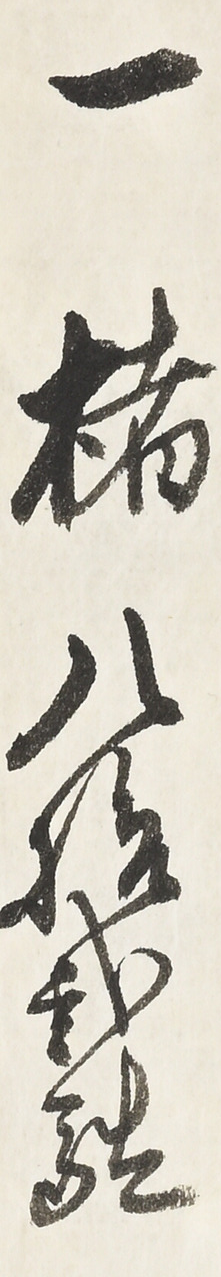一楮八拾弐駄但
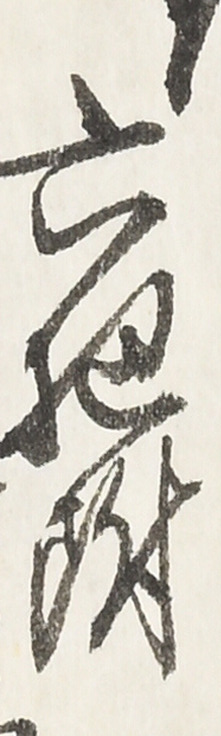六把附
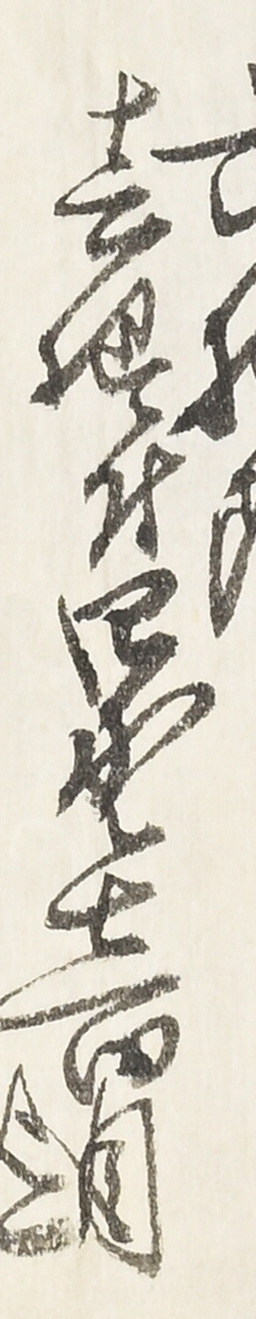壱把ニ付四貫七百目迄
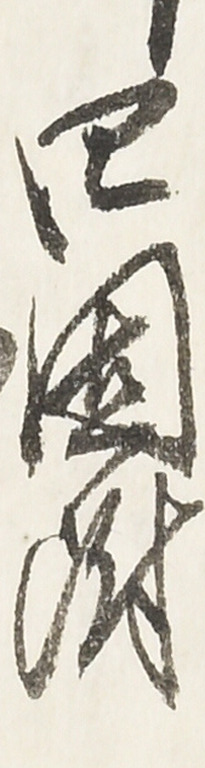四固附
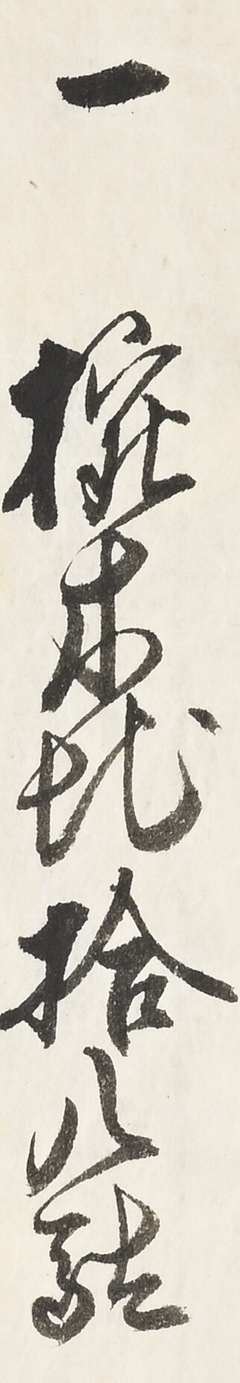一腕木地拾八駄但
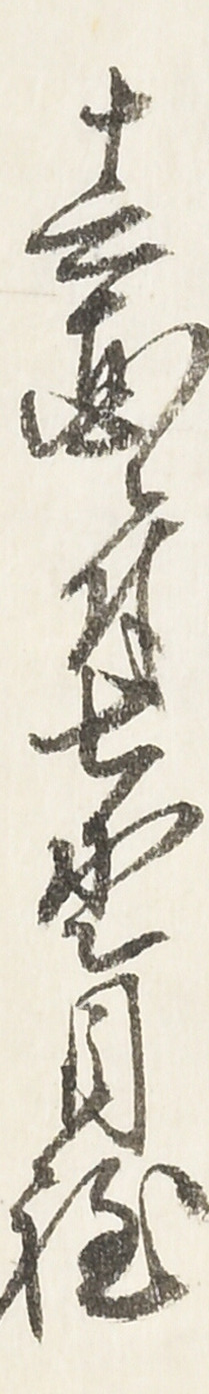壱固ニ付七貫目程
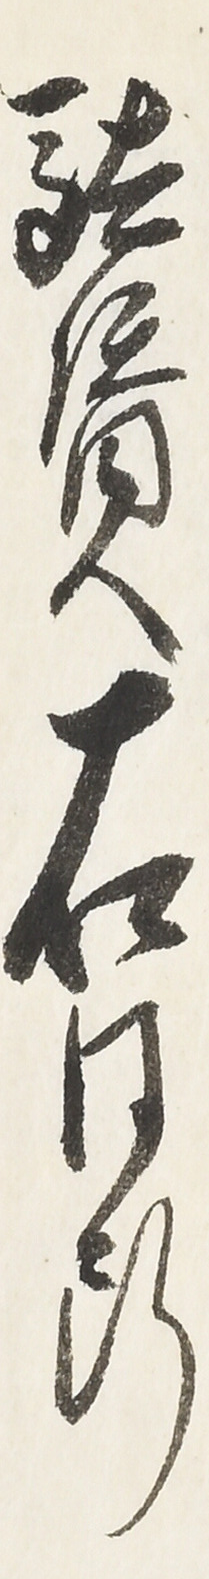駄賃右同断
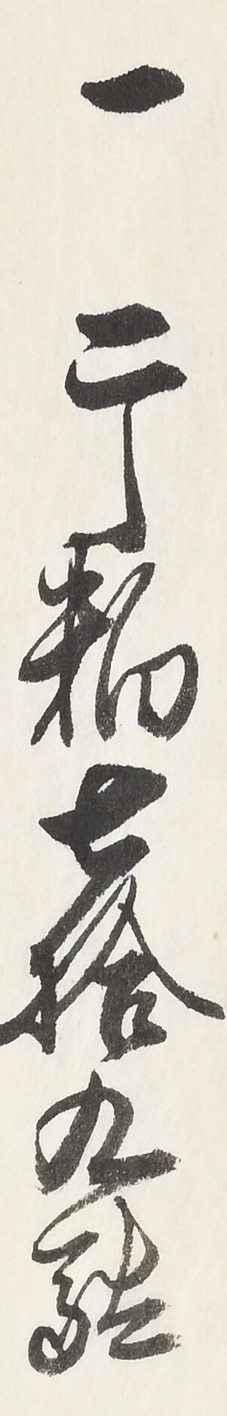一干粕七拾九駄但
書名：中馬ニテ附通候出入荷物目録帳
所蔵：伊那市立高遠町図書館・合同会社AMANE
